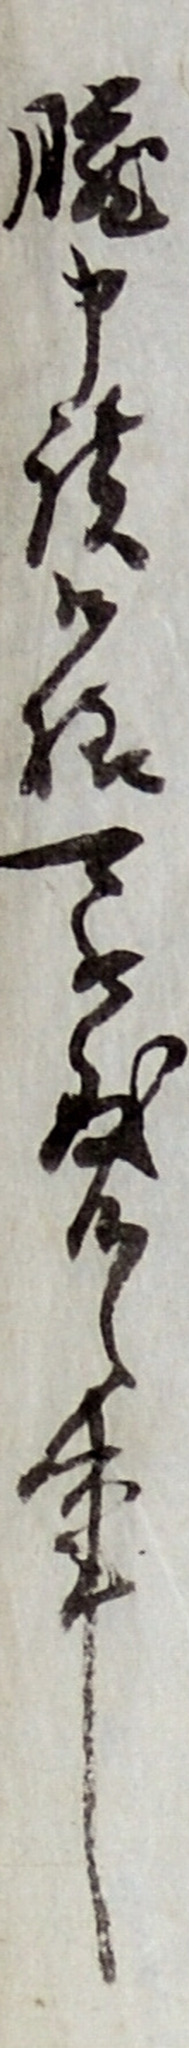臓申談候様可被致候之事

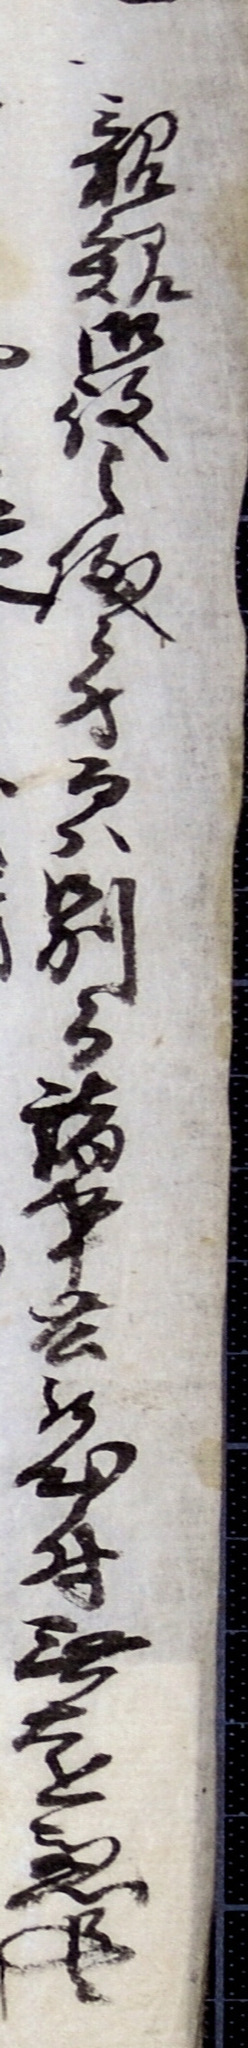一新規御役之儀ニ付而ハ別而諸事広被心付無遠慮
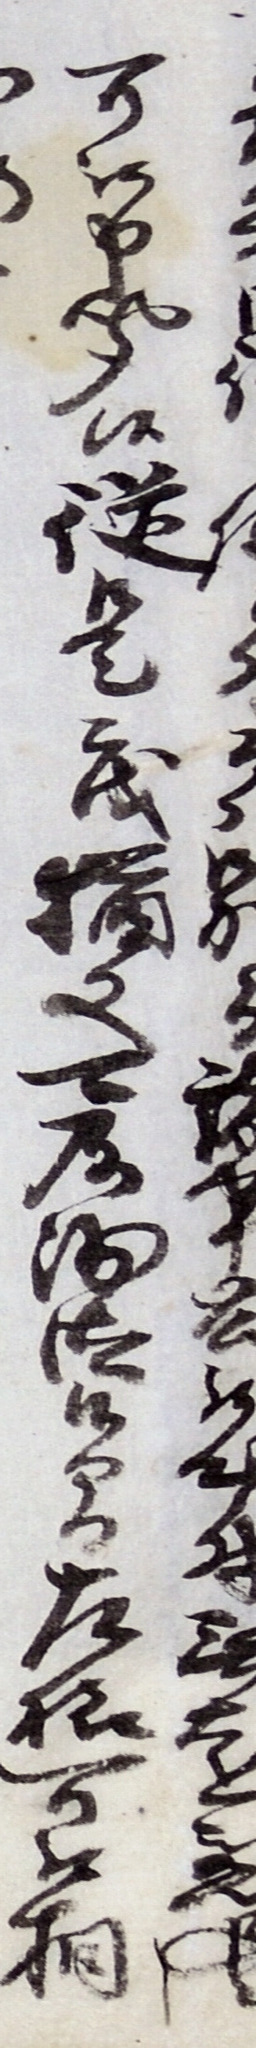可被申聞候従是茂猶又可及沙汰候間左様可被相
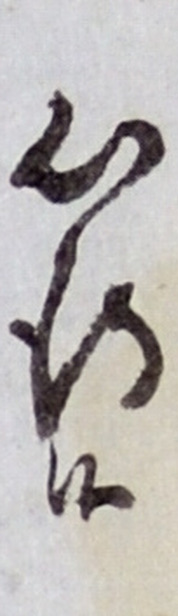心得候
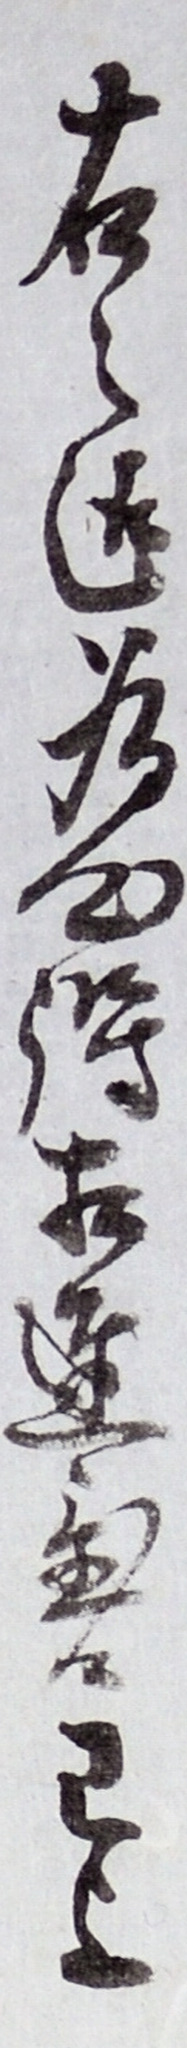右之趣為心得相達置候已上
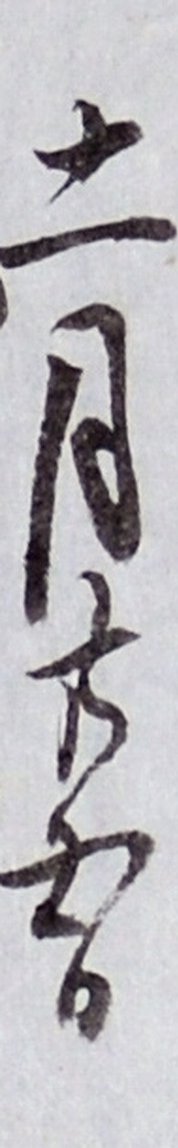十一月廿五日
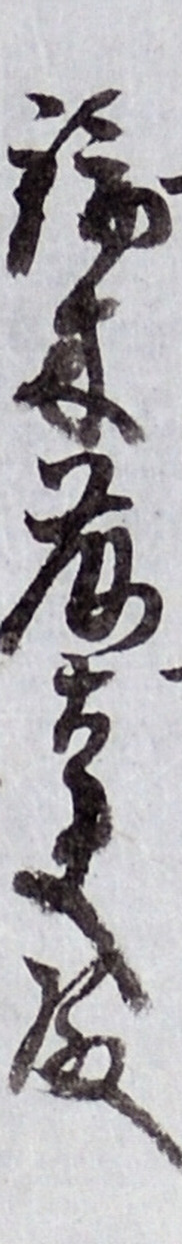鈴木藤太夫殿
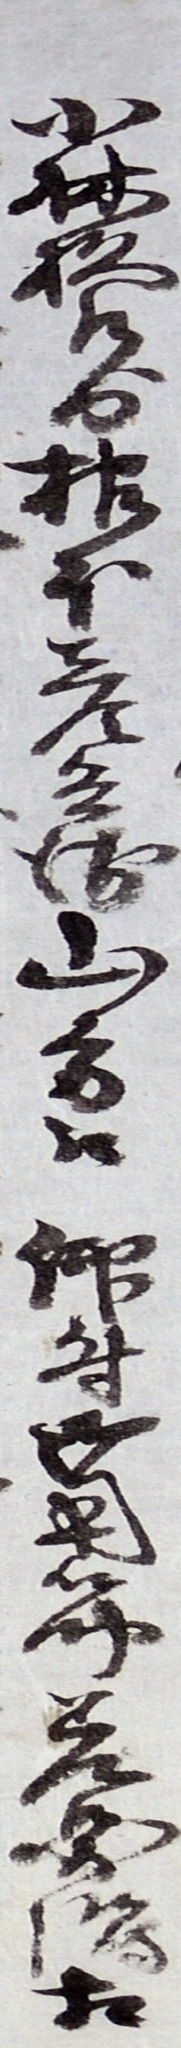一小林杦左衛門根本彦兵衛山方被仰付御用筋差図得相
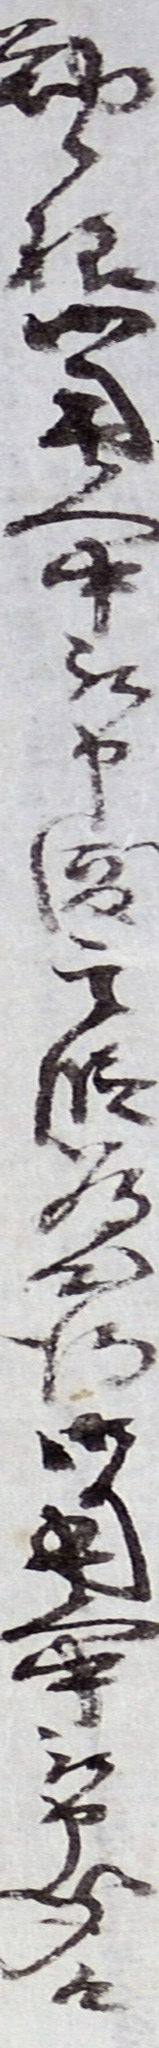勤候様御用人中被申渡其段為心得御用人中被申聞候
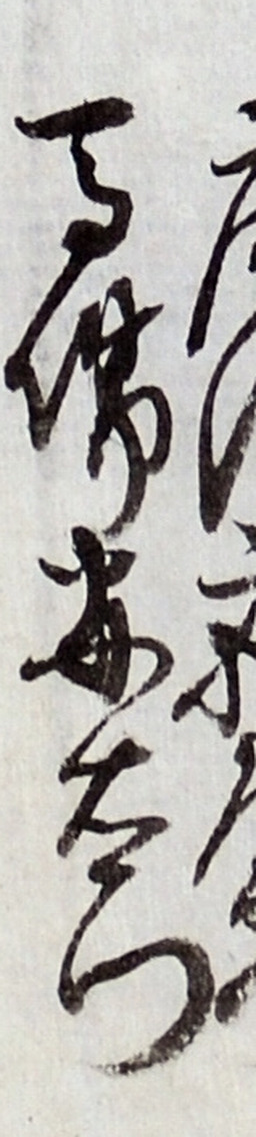馬場安右衛門
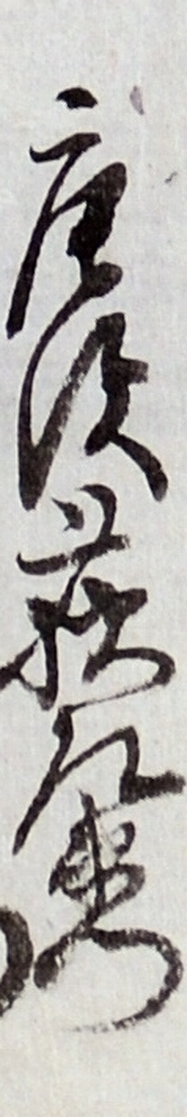唐沢萩左衛門
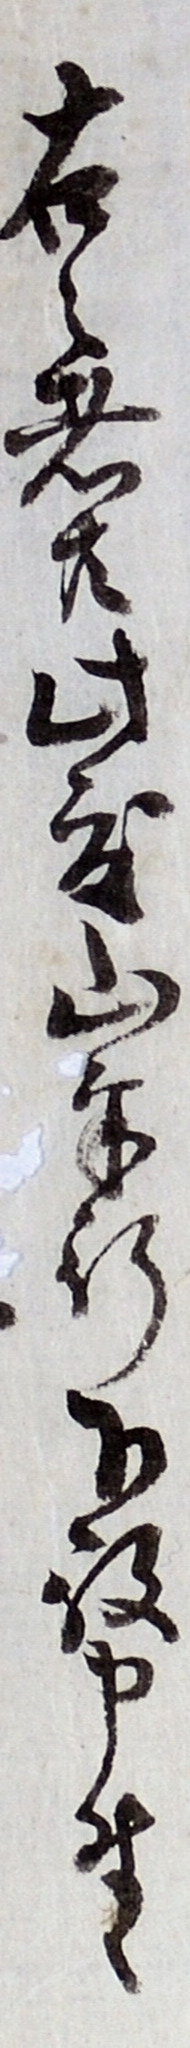右之者共此度山奉行下役申付候
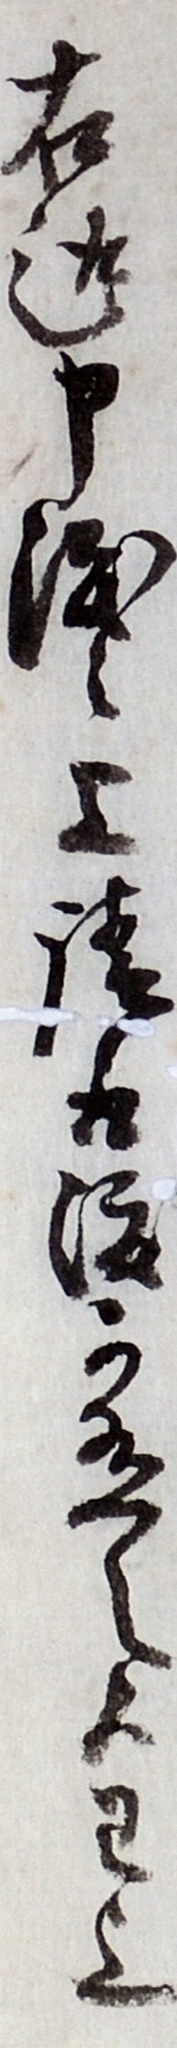右趣申渡候上請取渡可有之候已上
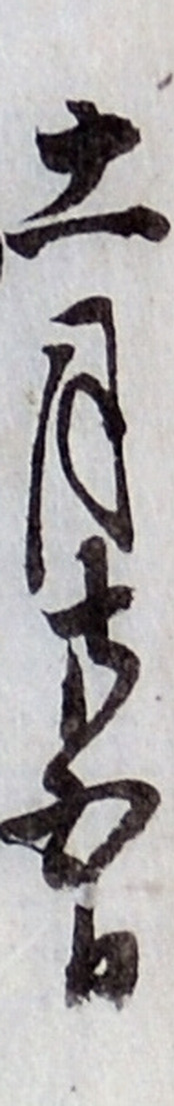十一月廿五日
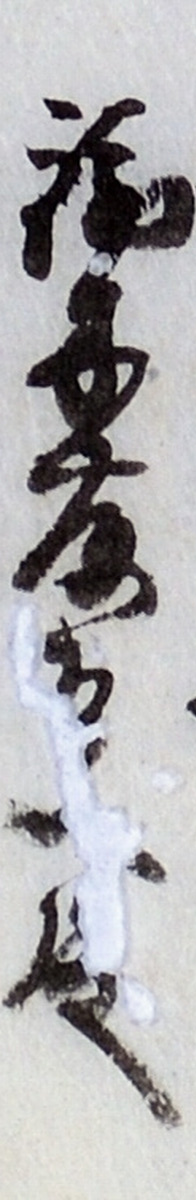鈴木藤太夫殿
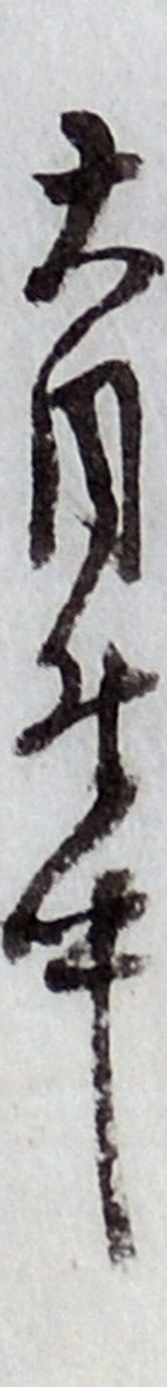大目付中
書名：御山奉行御用留
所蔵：伊那市立高遠町図書館・合同会社AMANE
